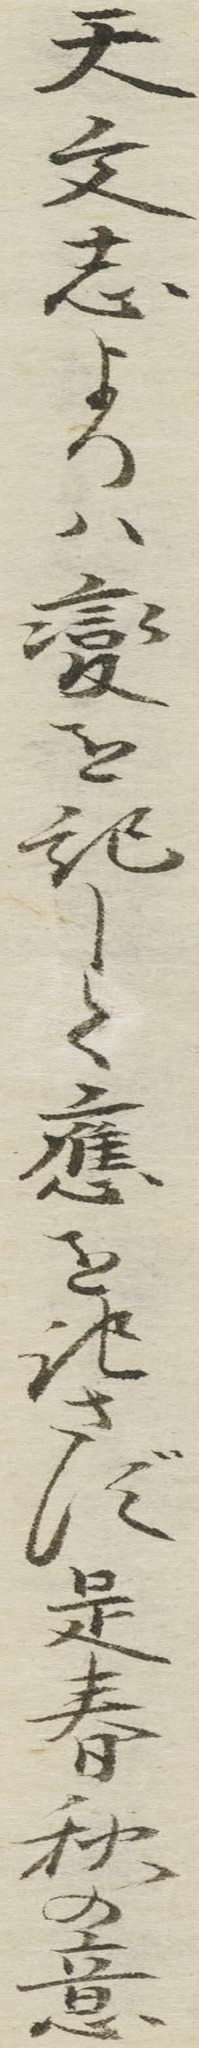天文志よりハ変を記して応を記さず是春秋の意
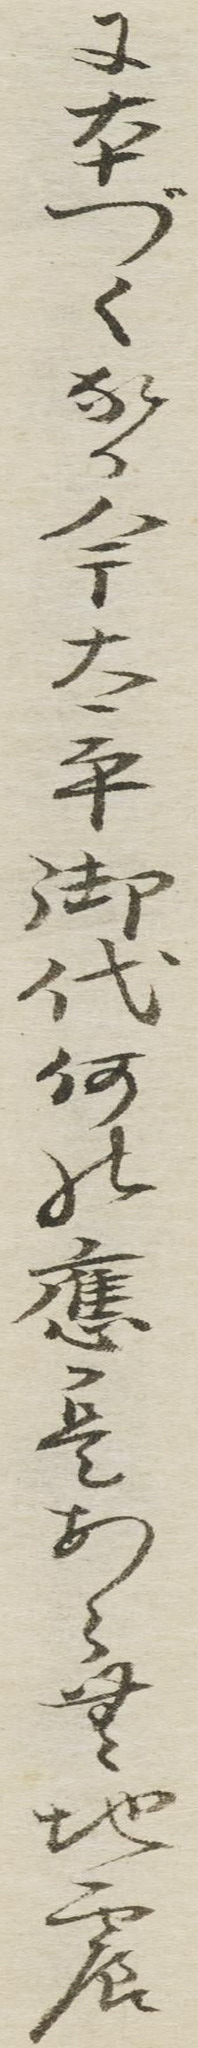に本づくなり今太平御代何の応フ是あらむ地震
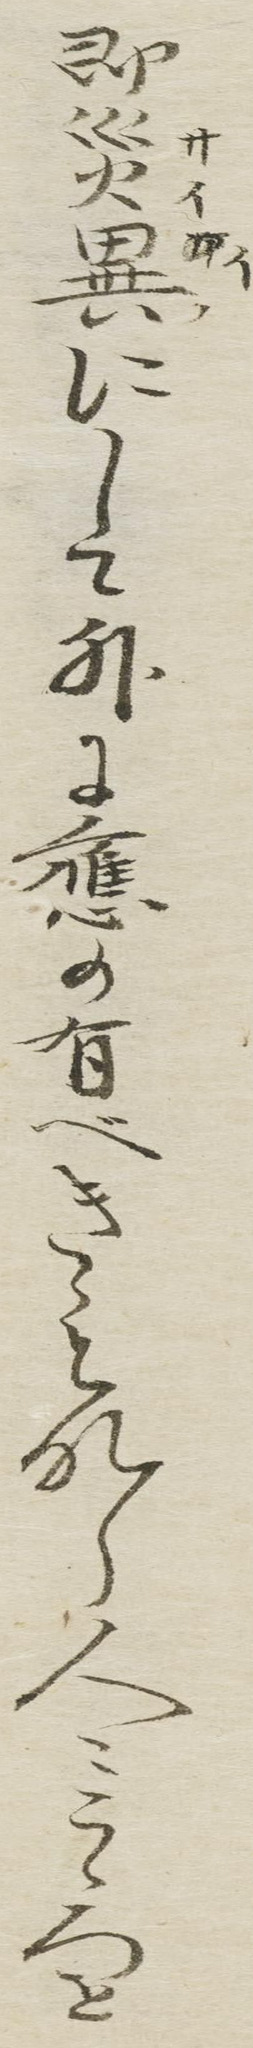即災異にして外に応の有べきとなり人にこころを
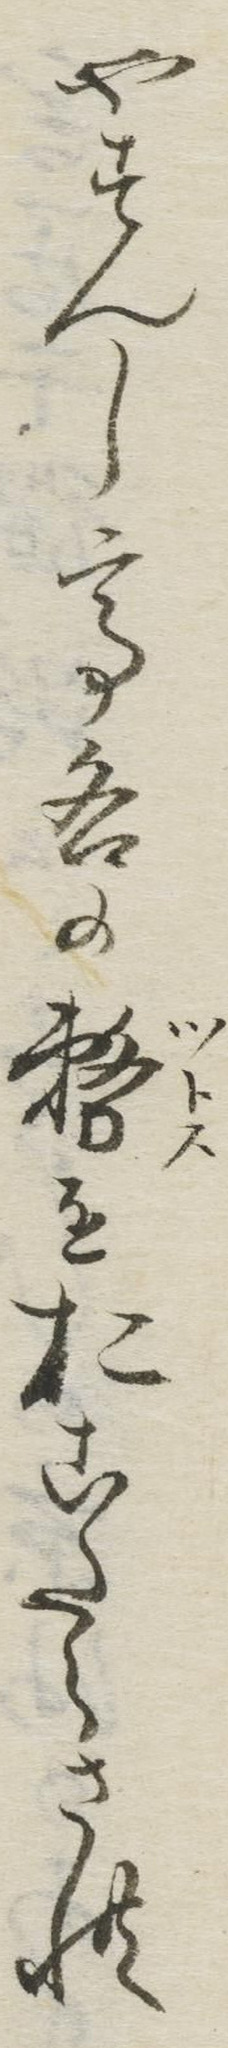やすんして各の務をおこたらざれ
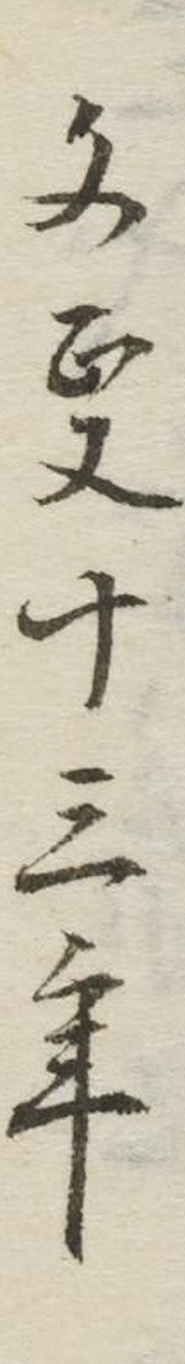文政十三年
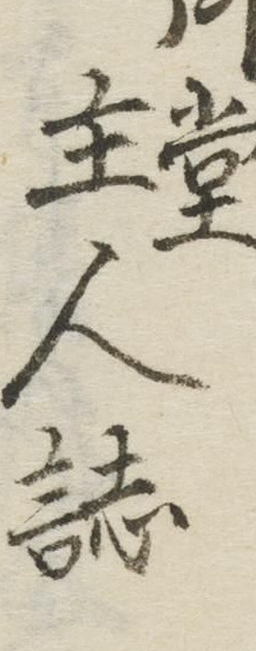主人誌
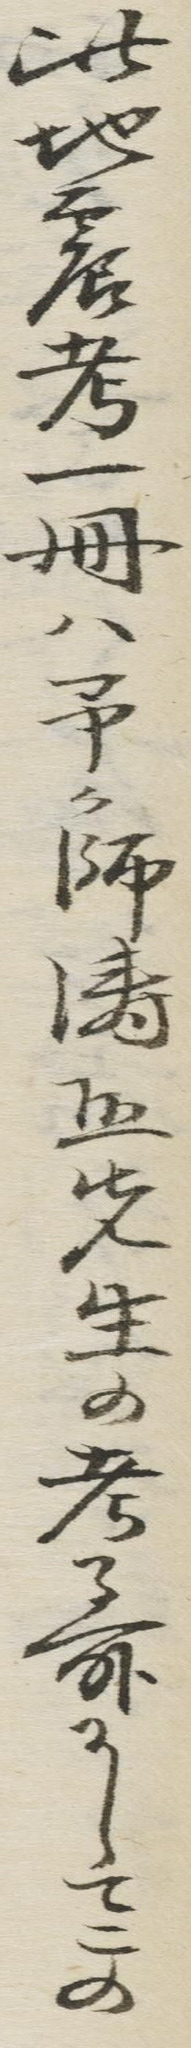此地震考一冊ハ予カ師濤山先生の考る所にしてこの
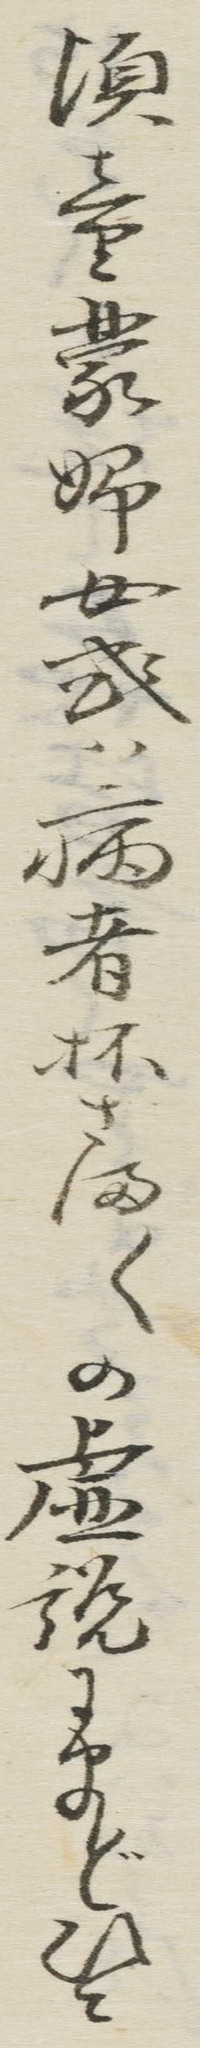頃童蒙婦女或ハ病者抔さま〳〵の虚説にまどひニ
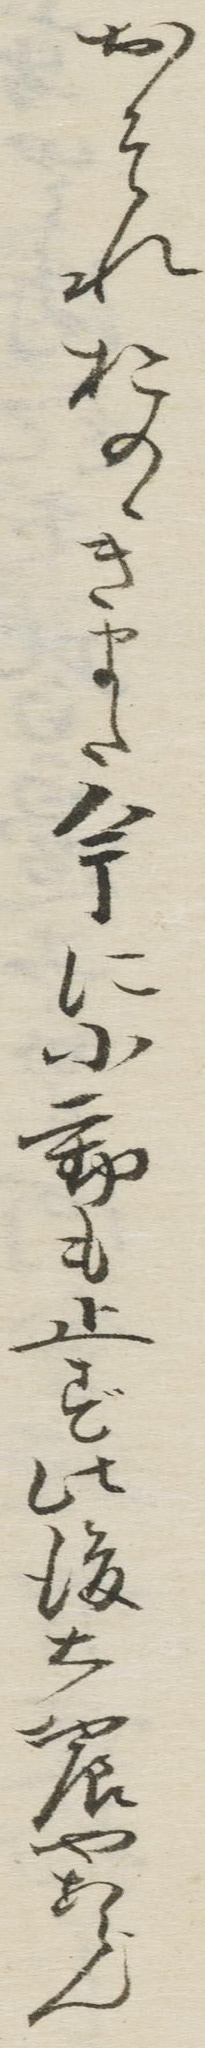おそれおのゝきまた今に小動も止ず此後大震やあらんと
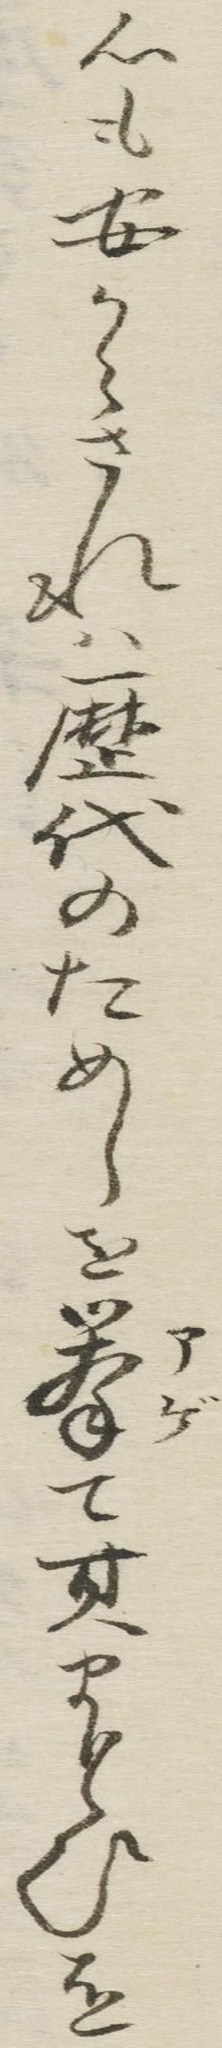心も安からされハ歴代のためしを挙て其まとひを
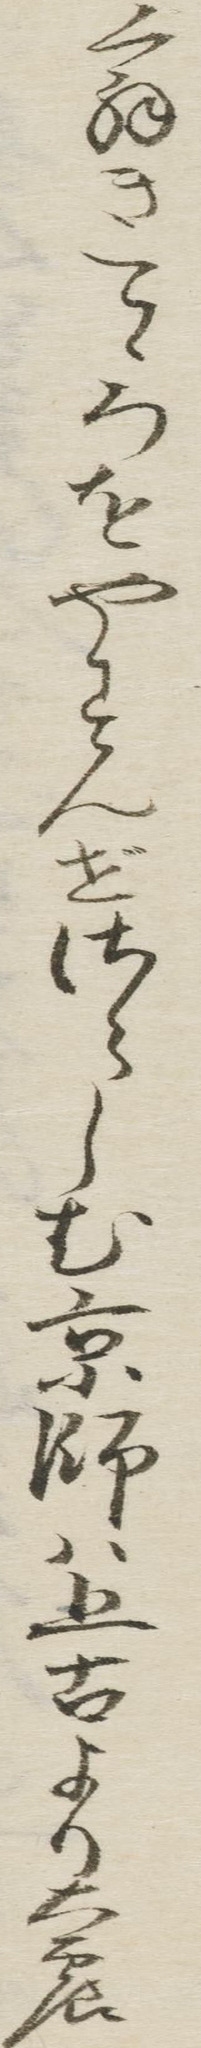解きてこゝろをやすんぜさらしむ京師ハ上古より大震も
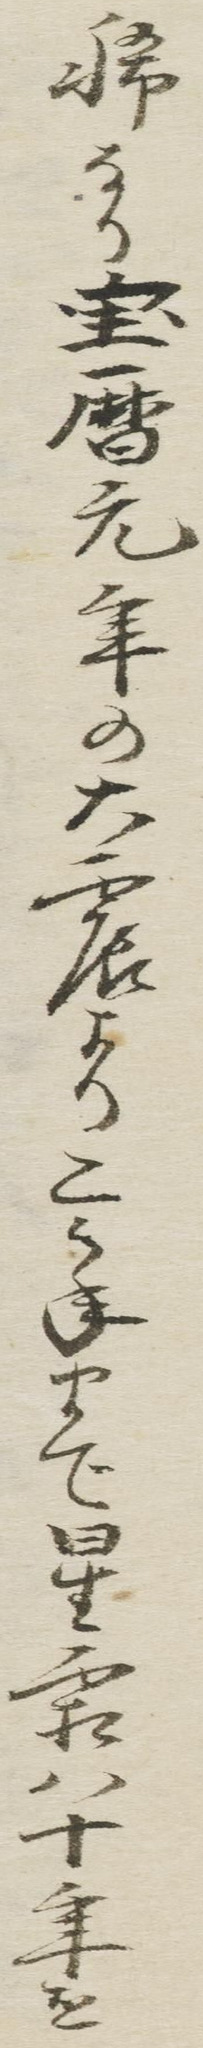稀なり宝暦元年の大震よりこの年まで星霜八十年を
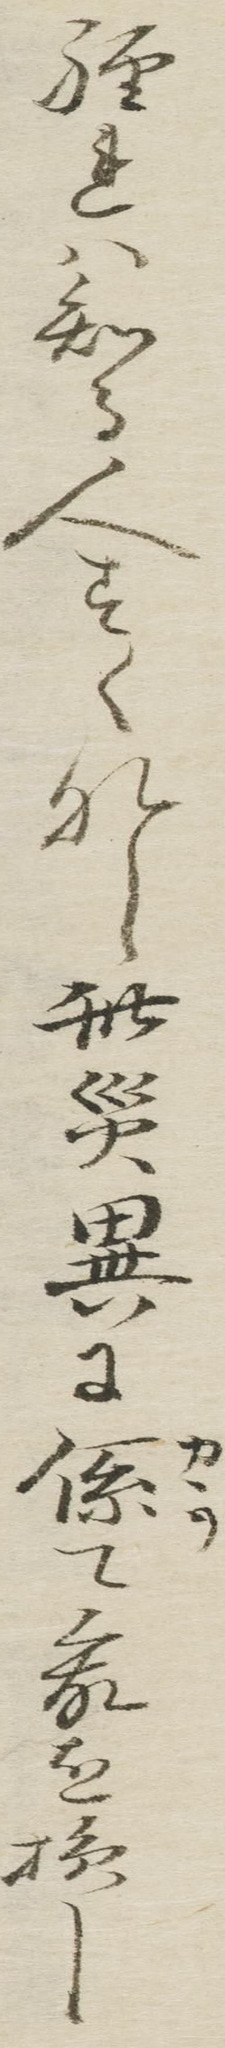経れハ知る人すくなし此災異に係て我を損じ

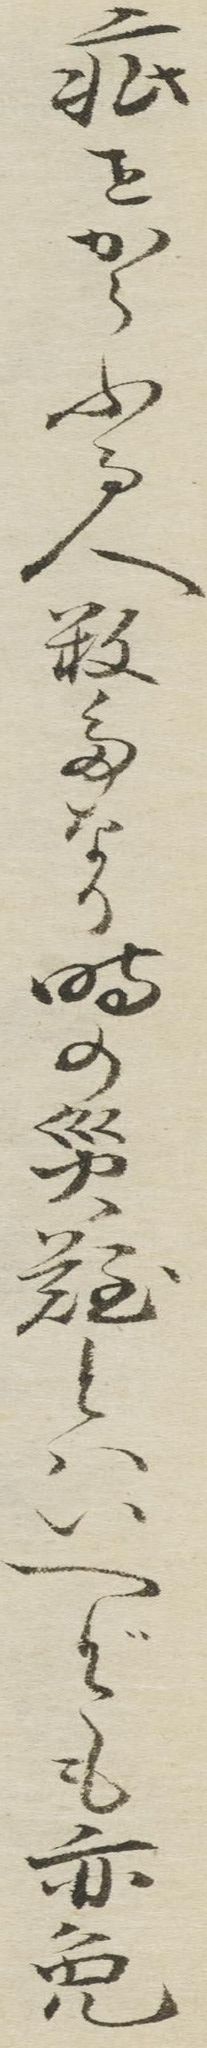疵をかうふる人数多なり時の災難とハいへども亦免
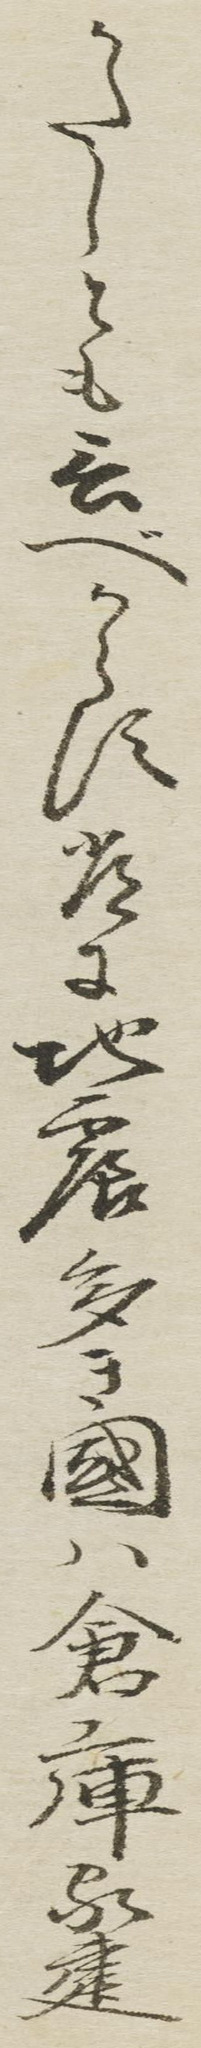かたしとも言べからず常に地震多き国ハ倉庫家建
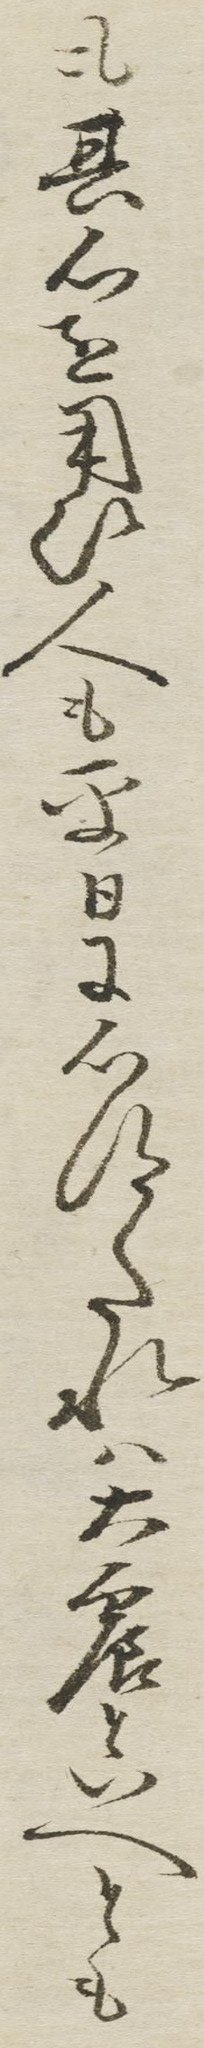も其心を用人も平日に心得たれハ大震といへとも
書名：諸国大地震大津波一代記
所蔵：東京大学地震研究所図書室 Earthquake Research Institute Library, The University of Tokyo, JAPAN
